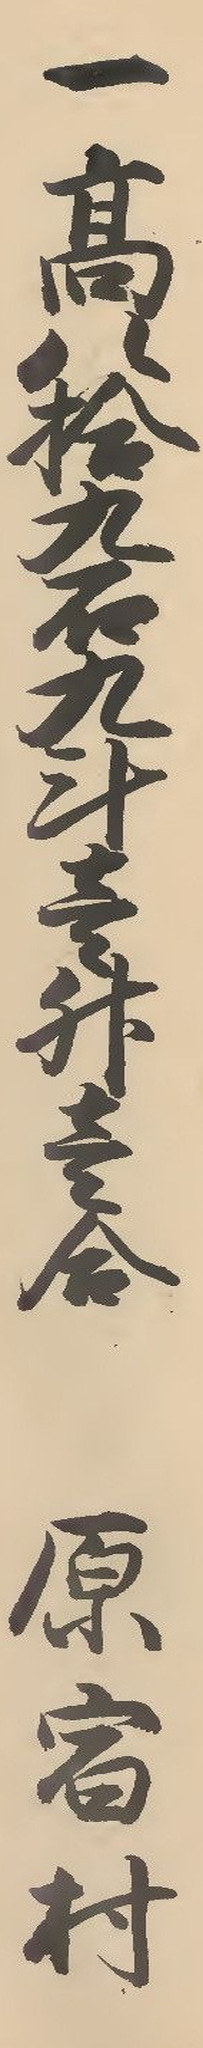一高八拾九石九斗壱升壱合原宿村
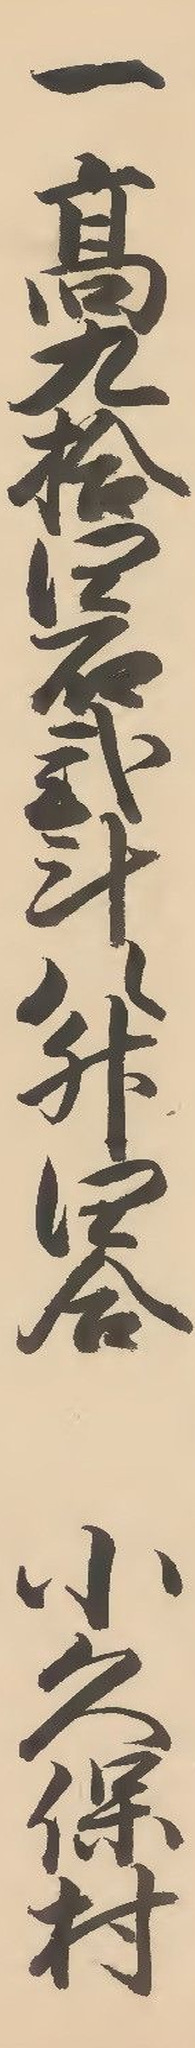一高九拾四石弐斗八升四合小久保村
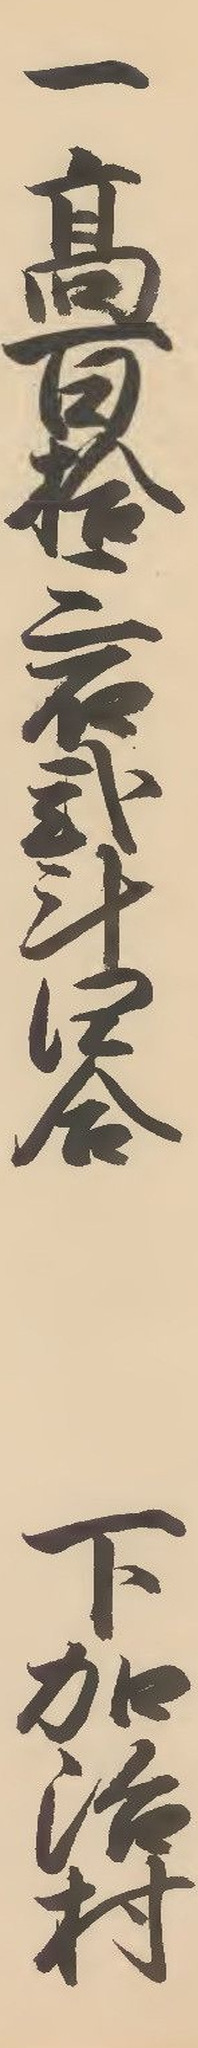一高百拾三石弐斗四合下加治村
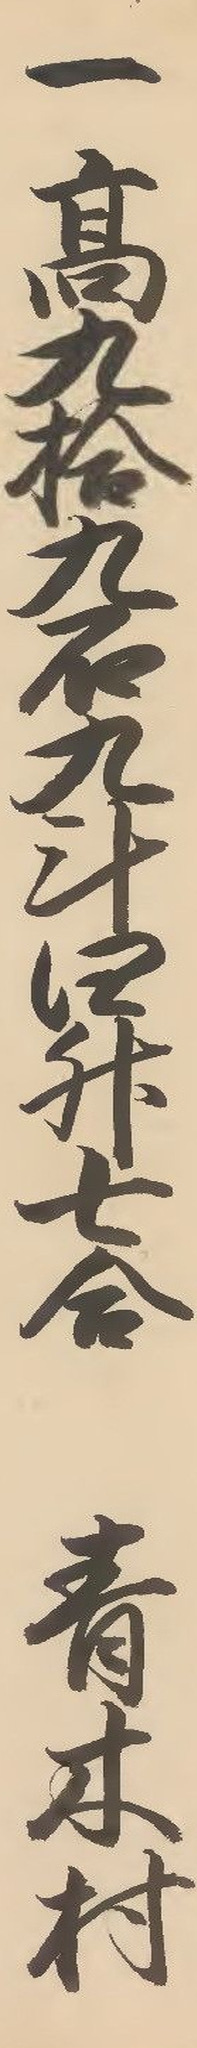一高九拾九石九斗四升七合青木村
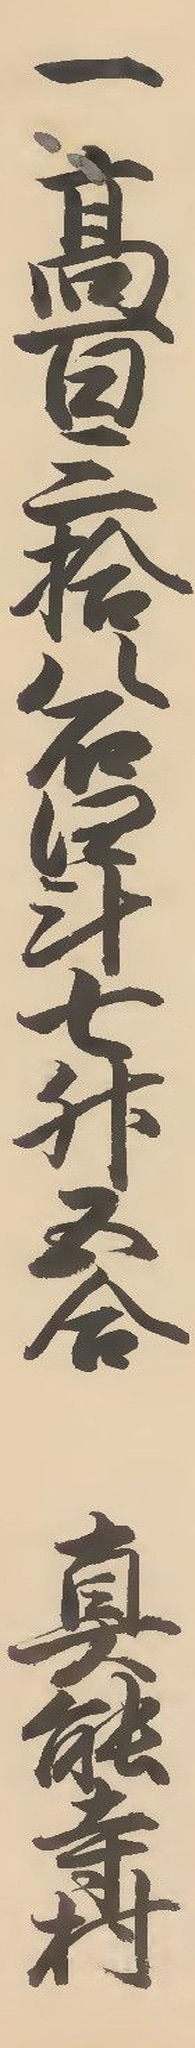一高百三拾八石四斗七升五合真能寺村

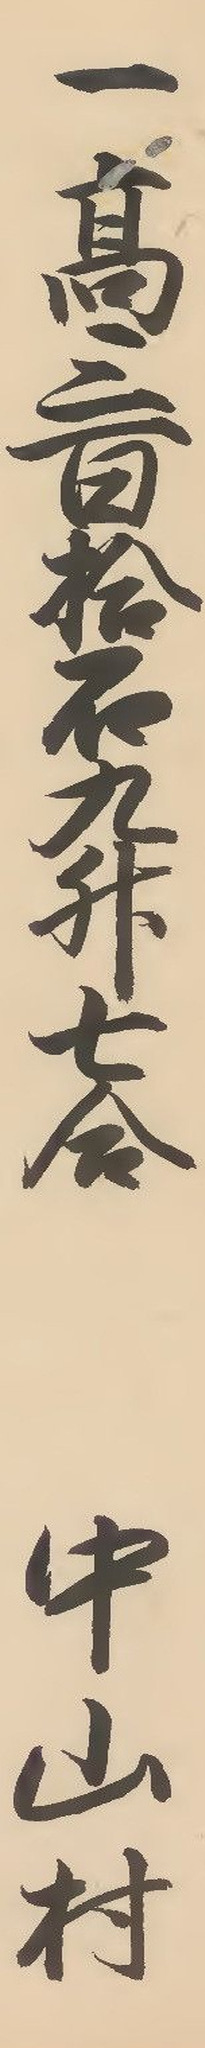一高三百拾石九升七合中山村
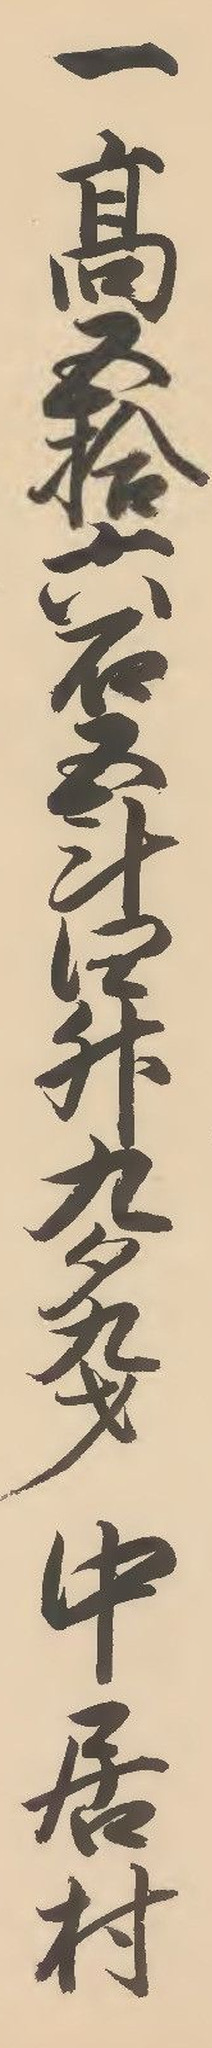一高五拾六石五斗四升九勺九才中居村
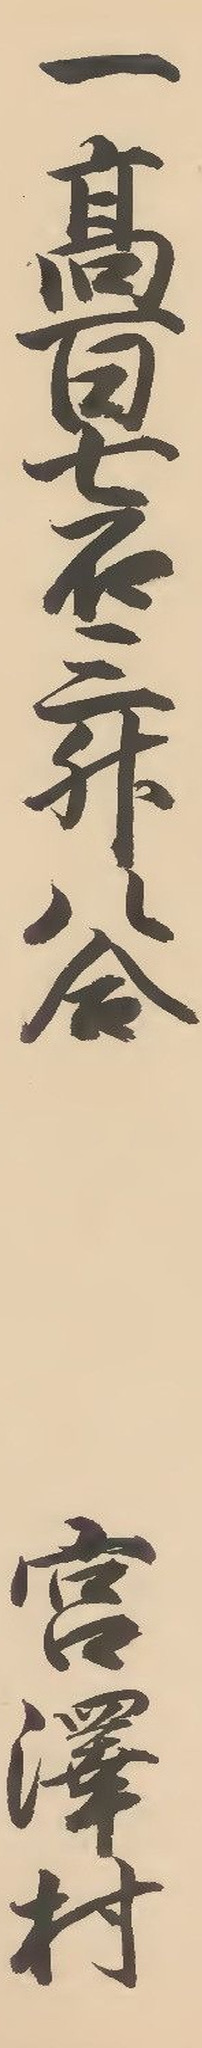一高百七石三升八合宮澤村
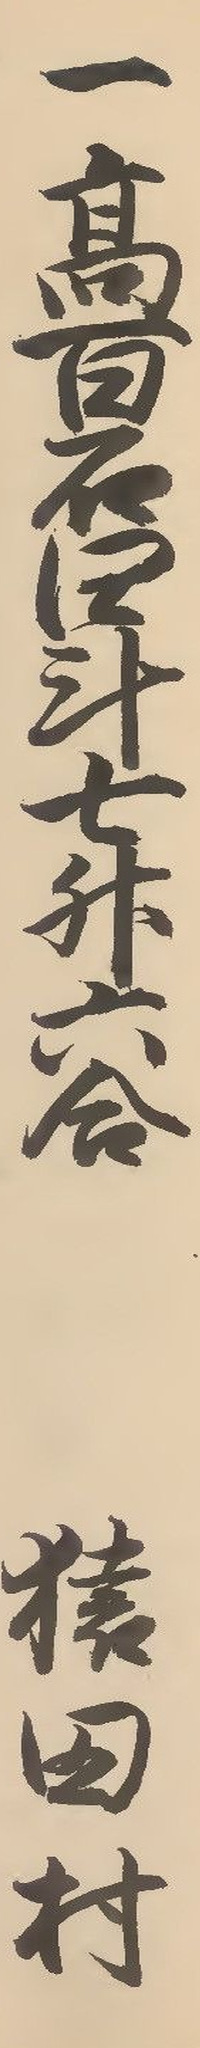一高百石四斗七升六合猿田村
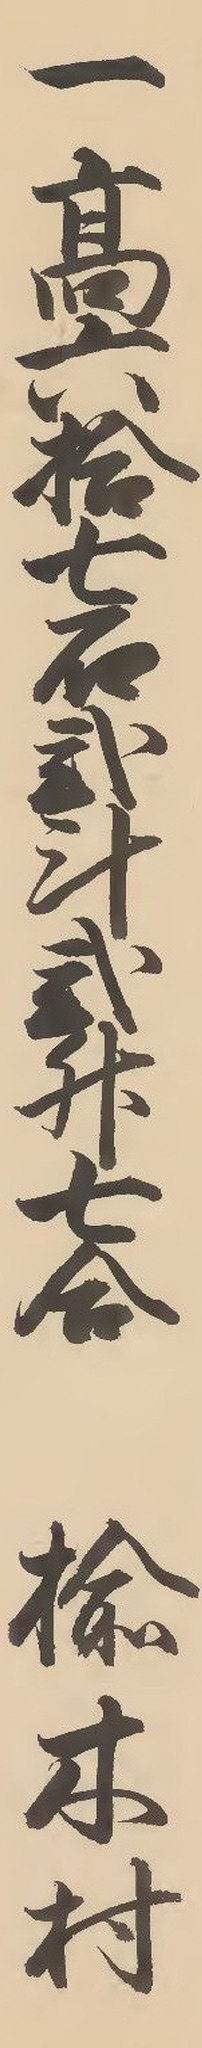一高六拾七石弐斗弐升七合楡木村
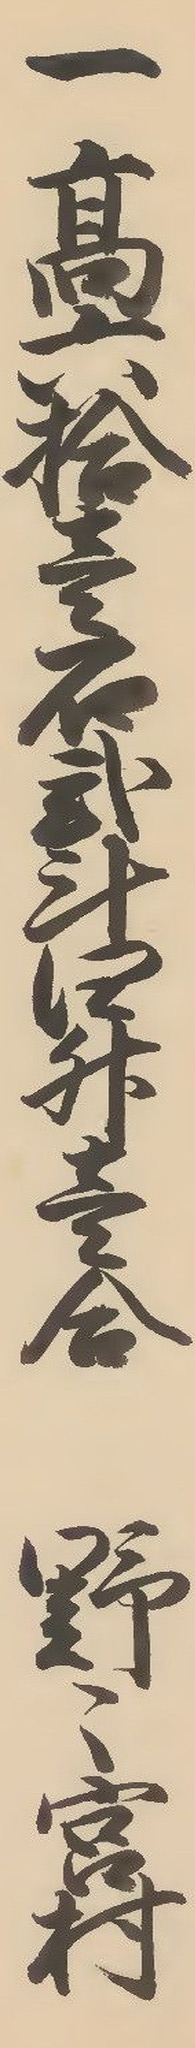一高六拾壱石弐斗四升壱合野々宮村
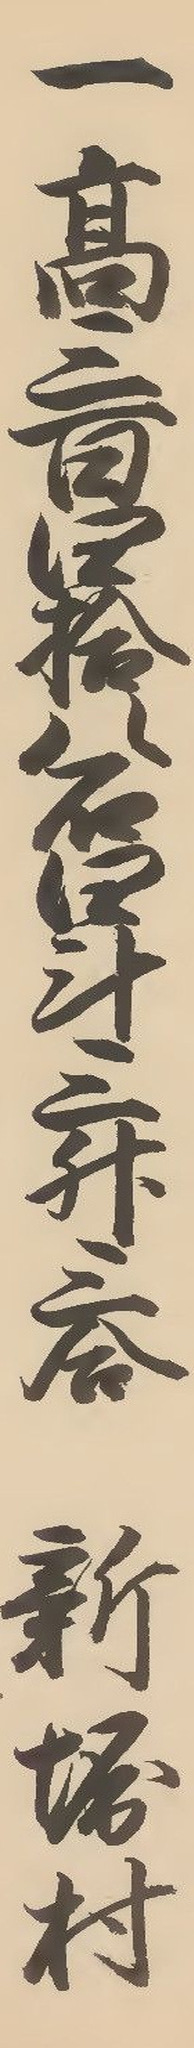一高三百四拾八石四斗三升三合新堀村
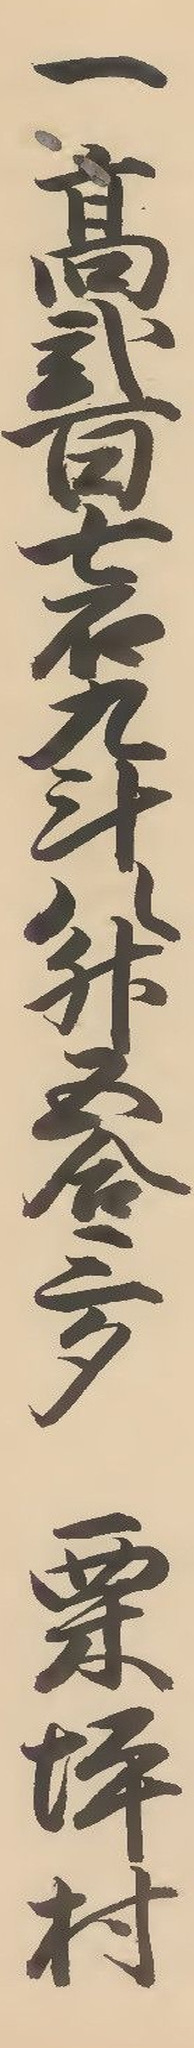一高弐百七石九斗八升五合三勺栗坪村

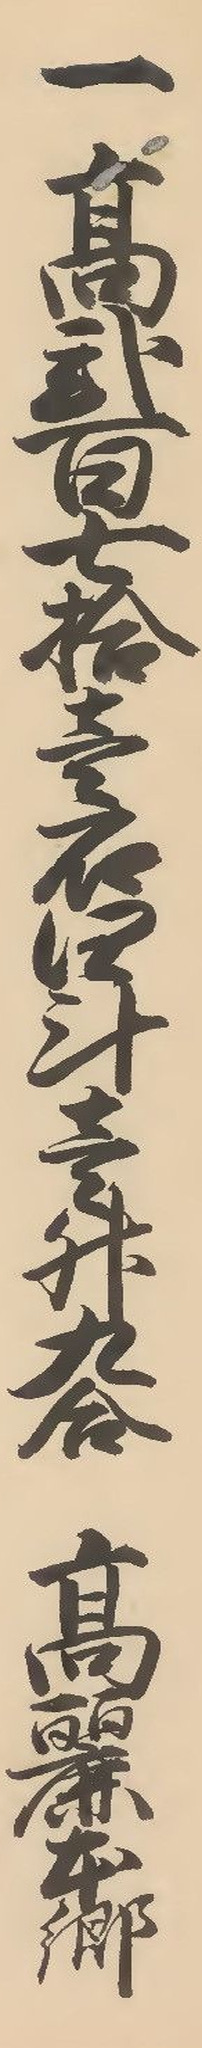一高弐百七拾壱石四斗壱升九合高麗本郷
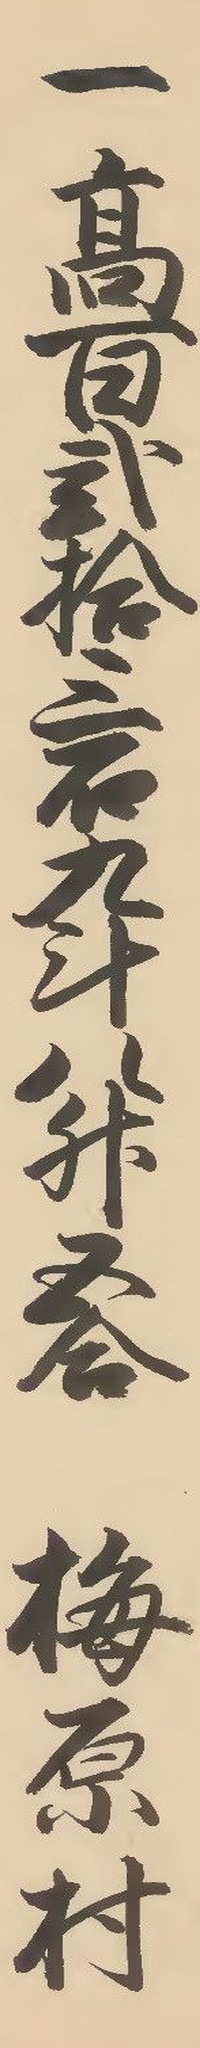一高百弐拾三石九斗八升五合梅原村
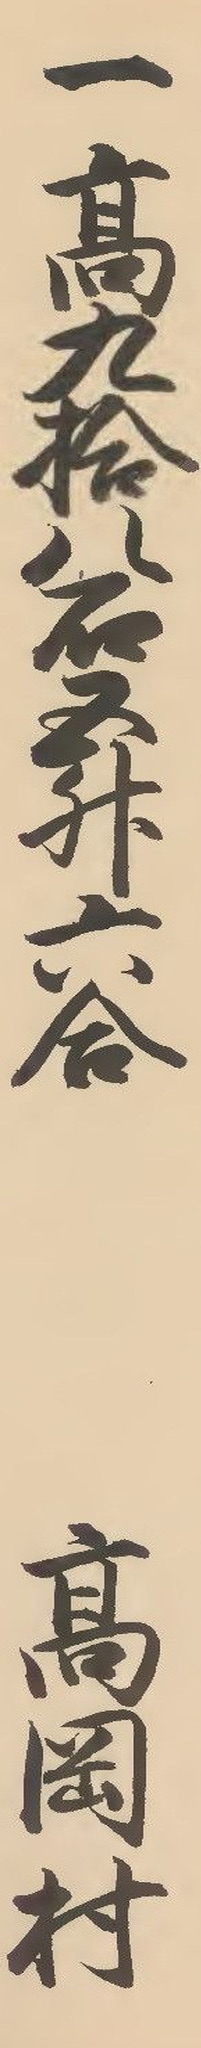一高九拾八石五升六合高岡村
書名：武蔵国郷帳　上
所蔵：国立公文書館 National Archives of Japan
